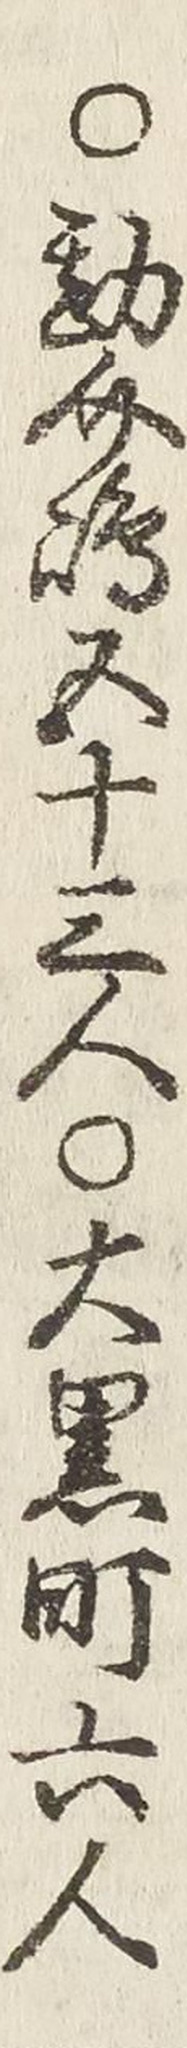○勘介嶋五十三人○大黒町六人
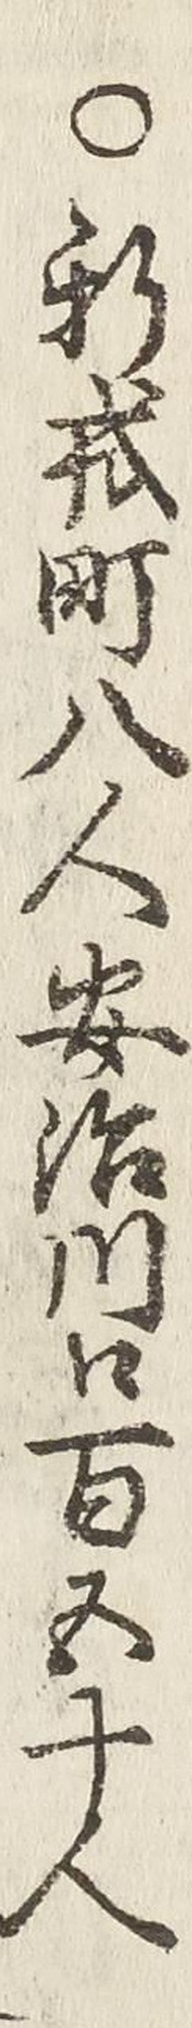○新戎町八人安治川口百五十人
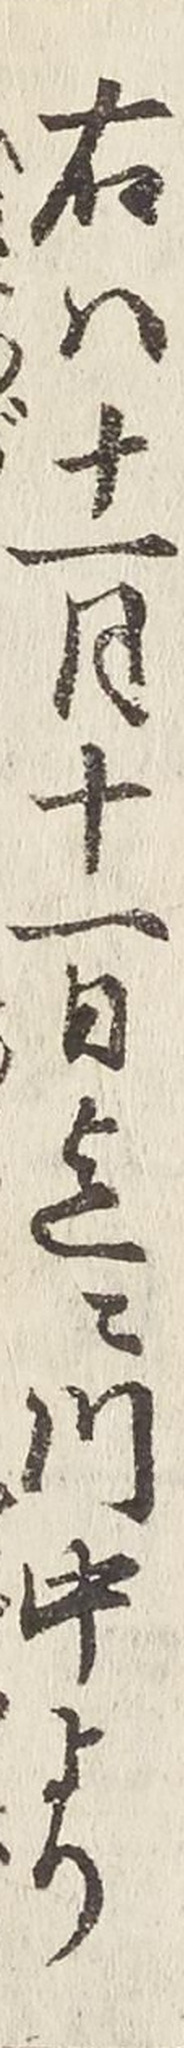右は十一月十一日迄に川中より

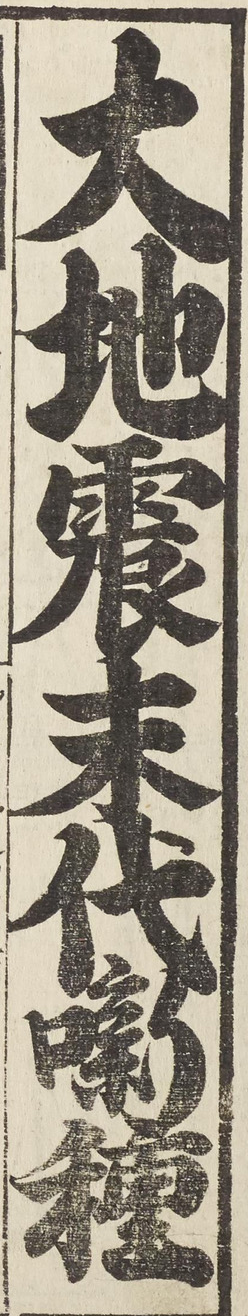大地震末代噺種

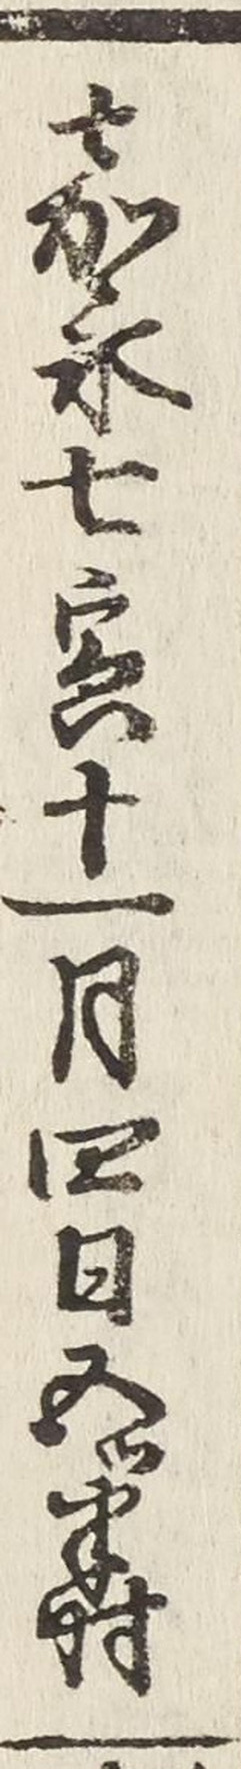嘉永七寅十一月四日五ツ半時
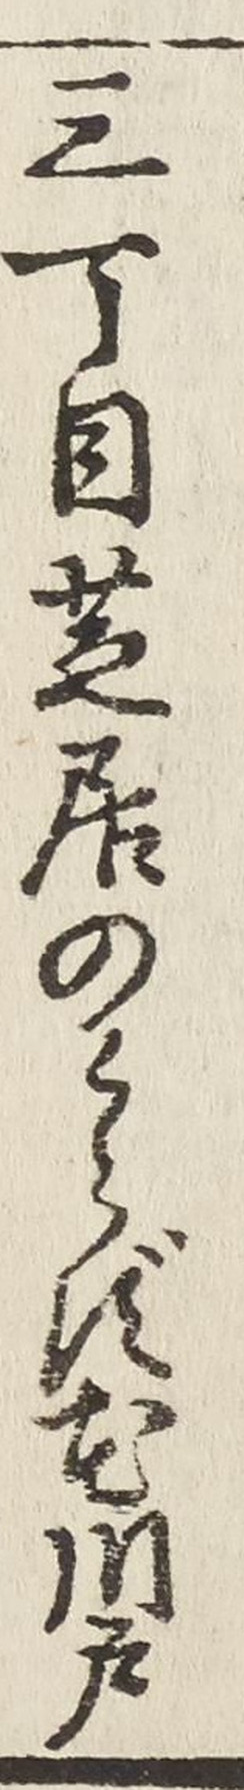三丁目芝居のこらず尤川戸
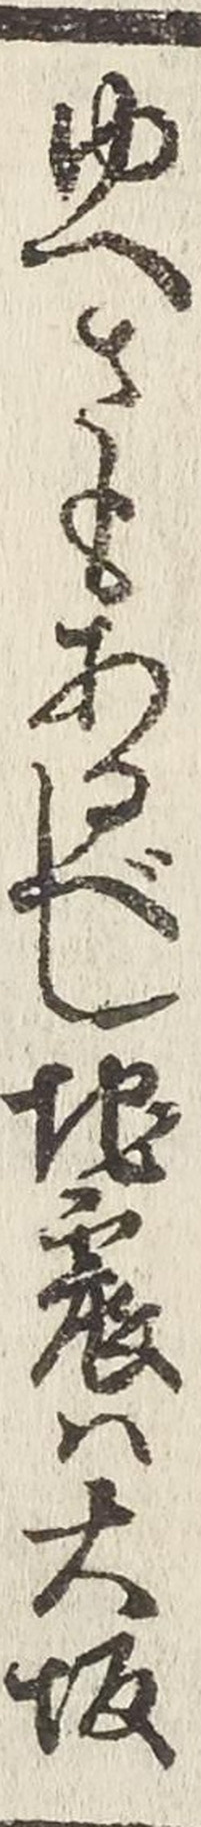ゆへさもあるべし地震は大坂
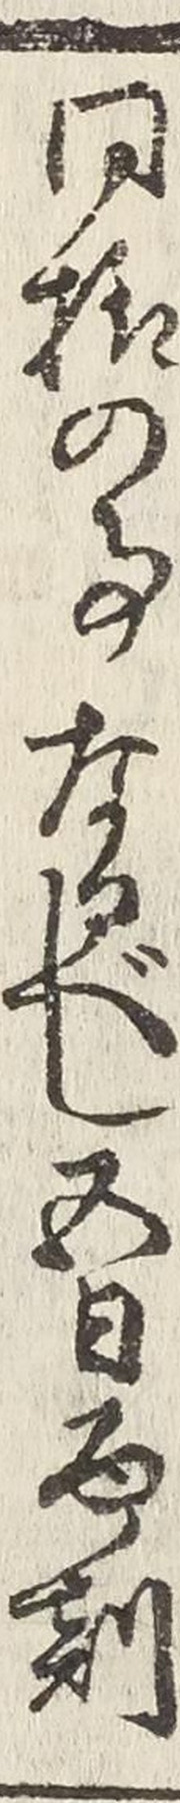同様の事なるべし五日酉ノ刻
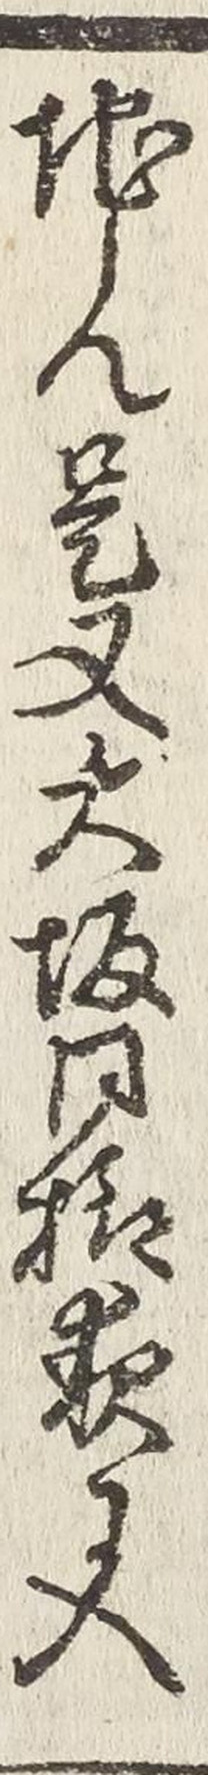地しん是又大坂同様夜に入
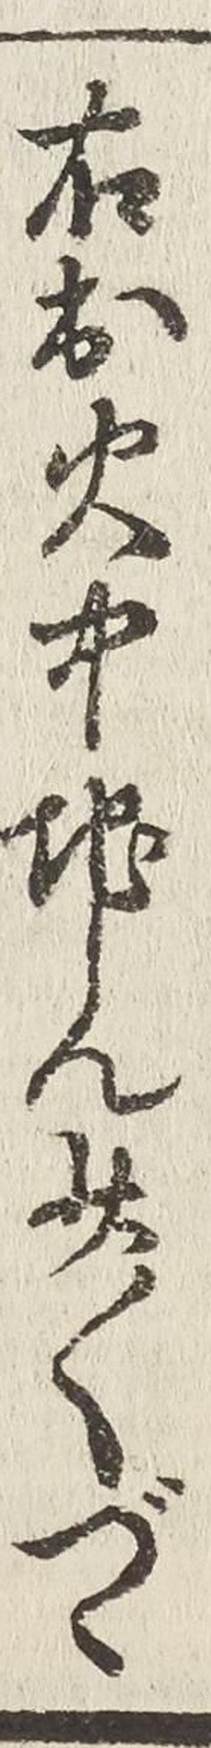右出火中地しん少〳〵づゝ
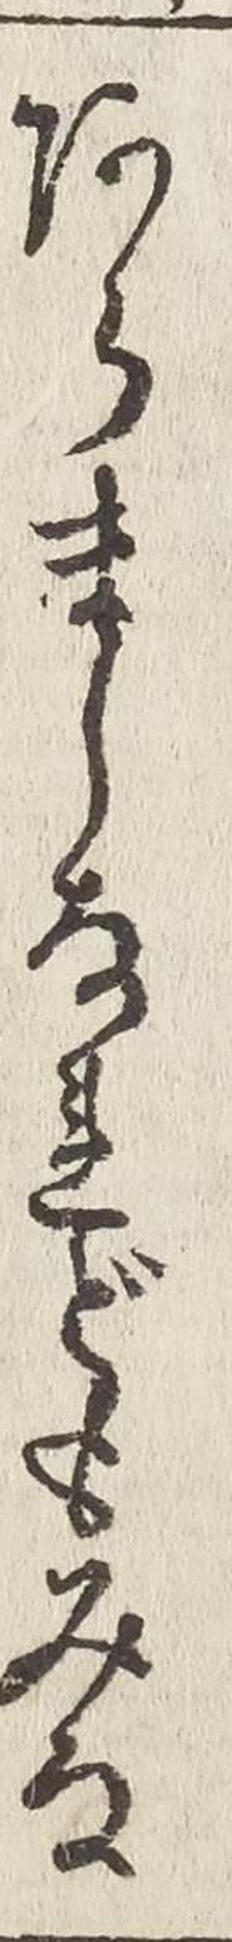あらましなれどもみな

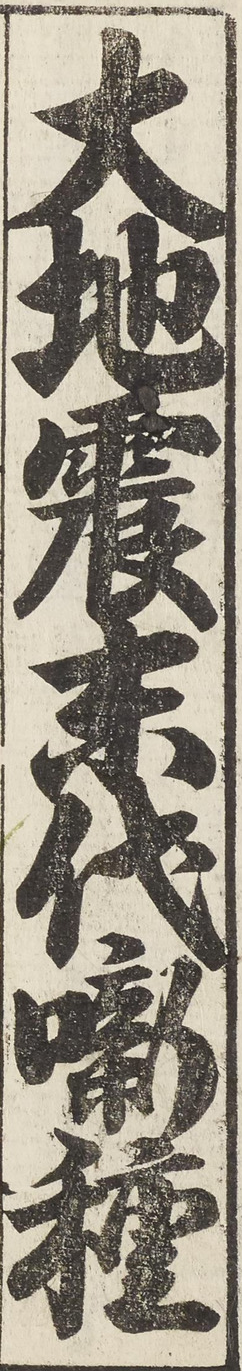大地震末代噺種

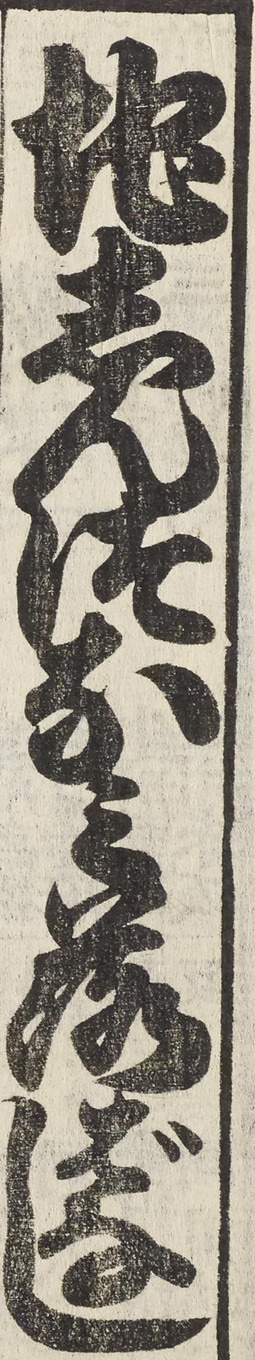地しんつなみ落ばなし

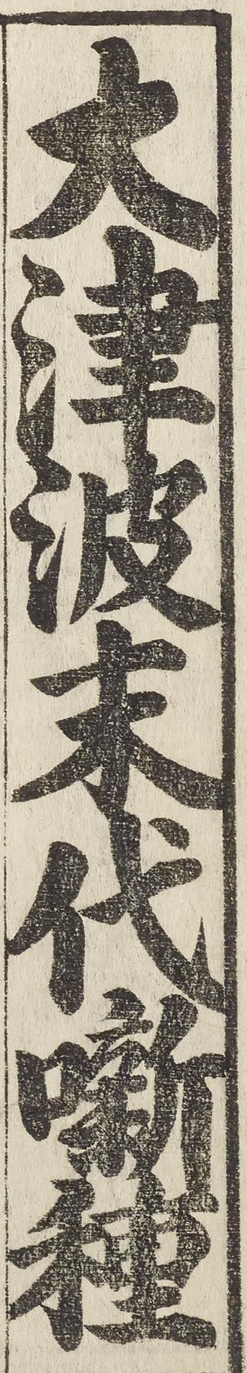大津波末代噺種
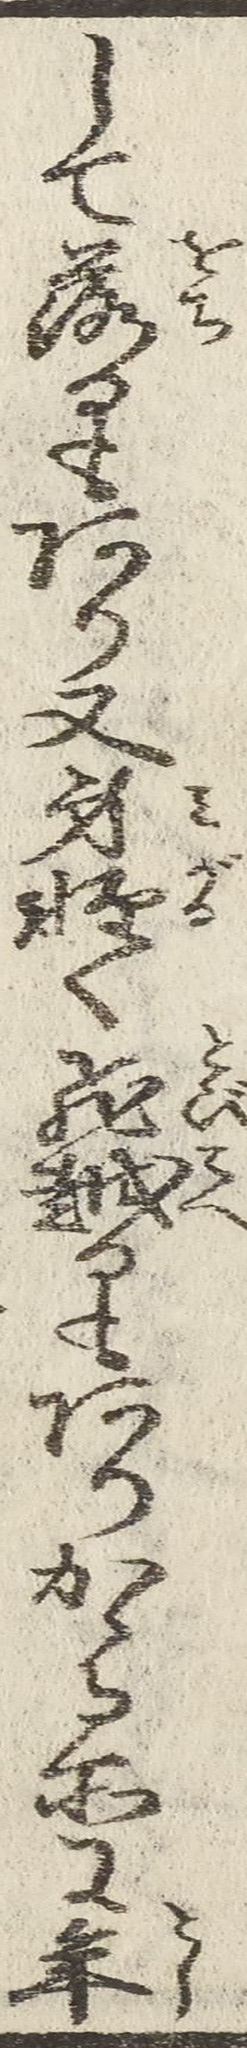して落るもあり又身軽く飛越るもありかゝる所に年
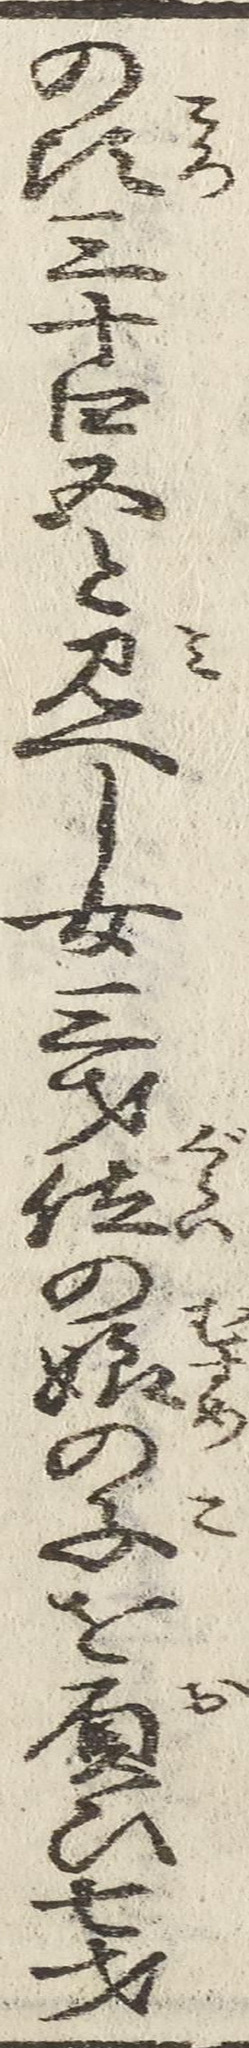の頃三十四五と見へし女三才位の娘の子を負ひ七才
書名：大地震大（津浪）末代噺（の）種　三編全
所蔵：東京大学地震研究所図書室 Earthquake Research Institute Library, The University of Tokyo, JAPAN
